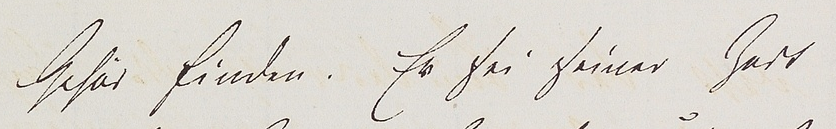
Gehör finden. Er sei seiner Zeit
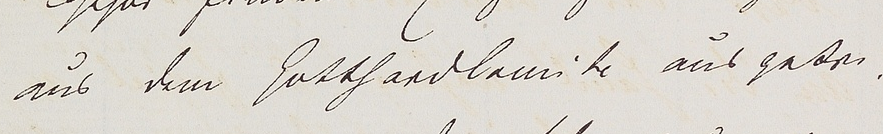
aus dem Gotthardkomite ausgetre-
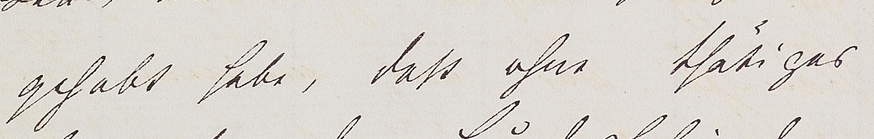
gehabt habe, daß ohne thätiges
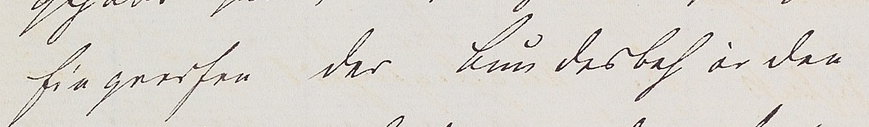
Eingreifen der Bundesbehörden
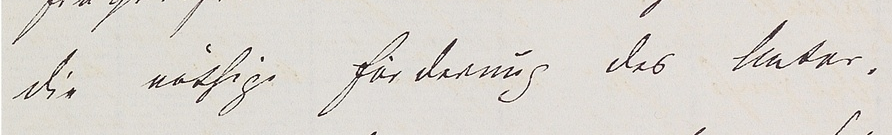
die nöthige Förderung des Unter-
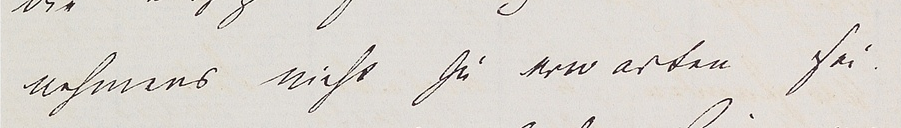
nehmens nicht zu erwarten sei.
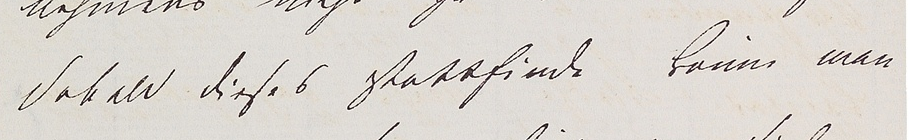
Sobald dieses stattfinde könne man
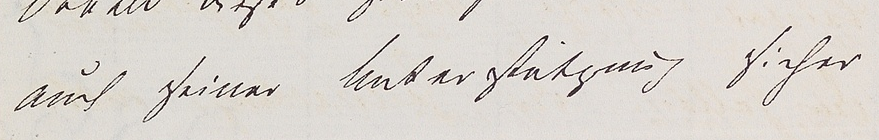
auch seiner Unterstützung sicher
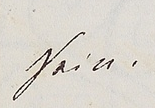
sein.
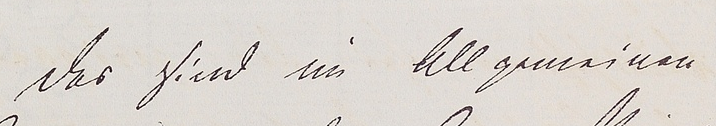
Das sind im Allgemeinen
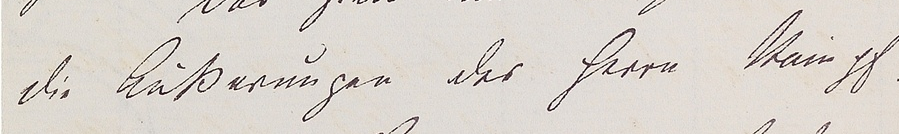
die Äußerungen des Herrn Stämpf-
